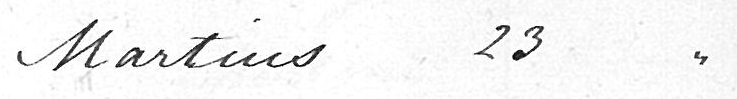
Martius 23 "
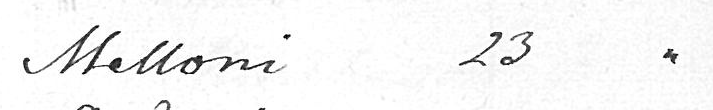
Melloni 23 "
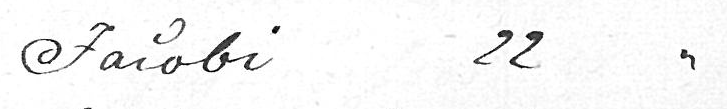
Jacobi 22 "
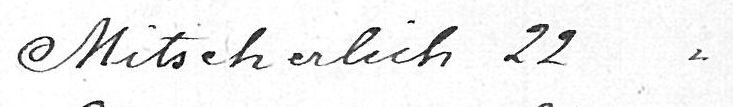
Mitscherlich 22 "
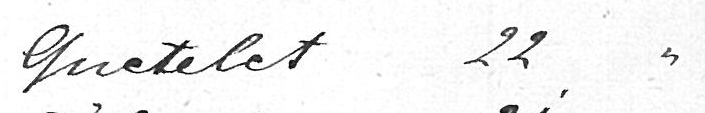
Quetelet 22 "
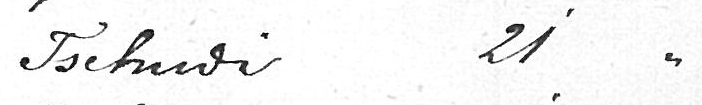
Tschudi 21 "
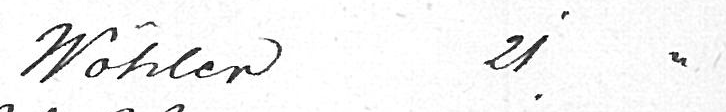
Wöhler 21 "
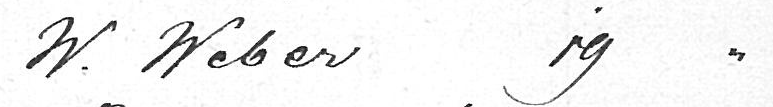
W. Weber 19 "
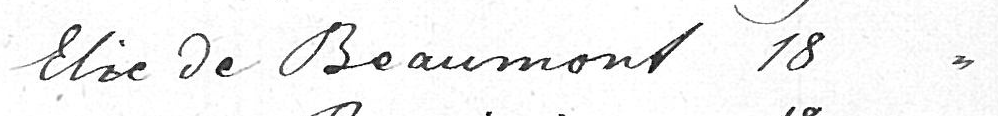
Elie de Beaumont 18 "
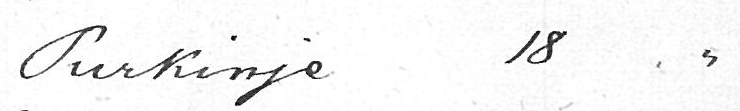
Purkinje 18 "
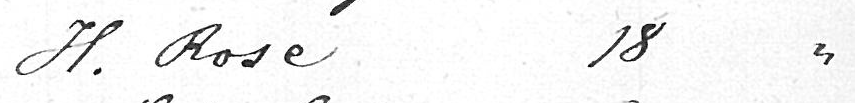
H. Rose 18 "
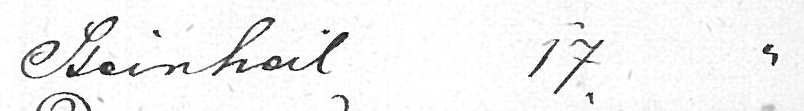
Steinheil 17 "
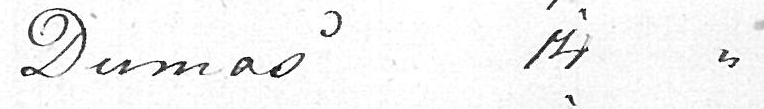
Dumas 14 "
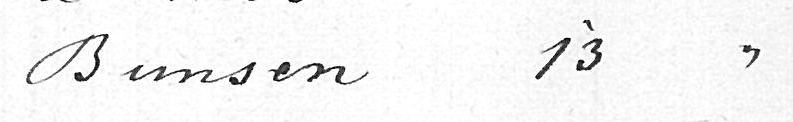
Bunsen 13 "
